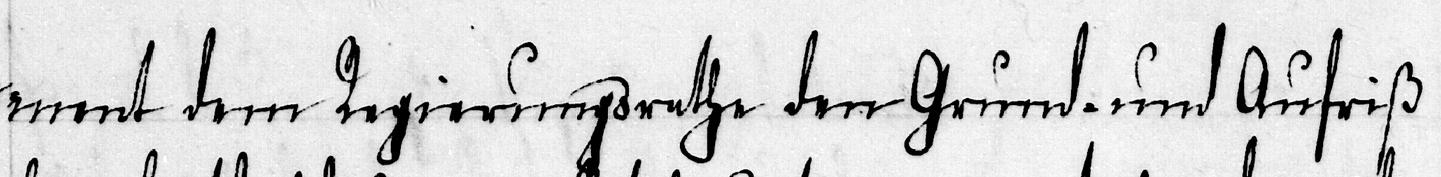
ment dem Regierungsrathe den Grund- und Aufriß
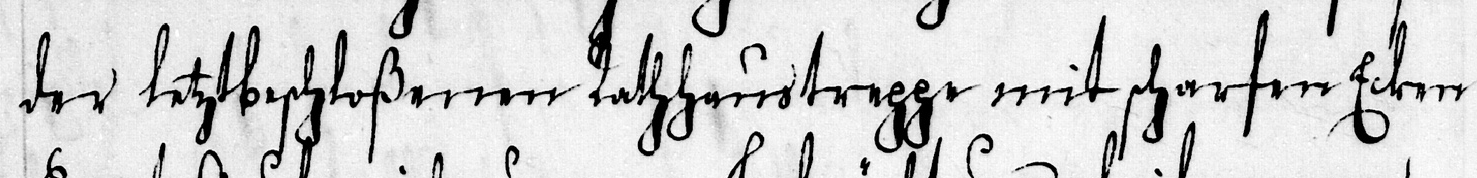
der letztbeschloßenen Rathhaustreppe mit scharfen Ecken
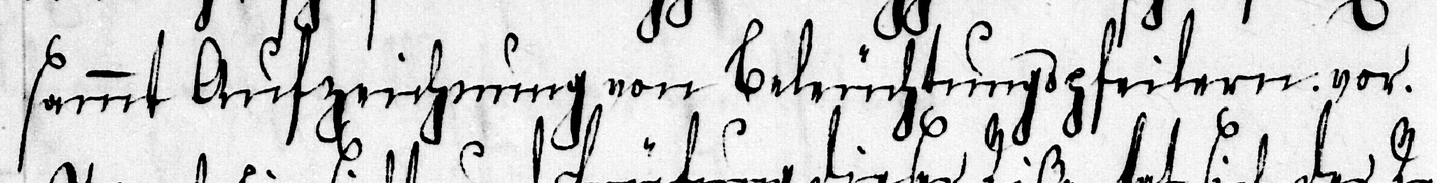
sammt Aufzeichnung von Beleuchtungspfeilern vor.
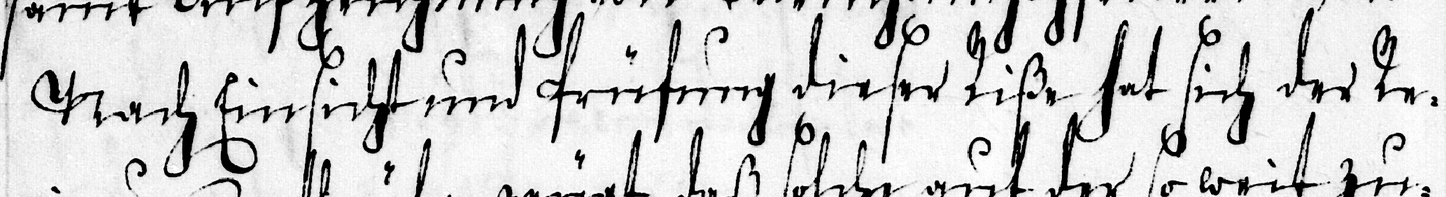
Nach Einsicht und Prüfung dieser Riße hat sich der Re¬
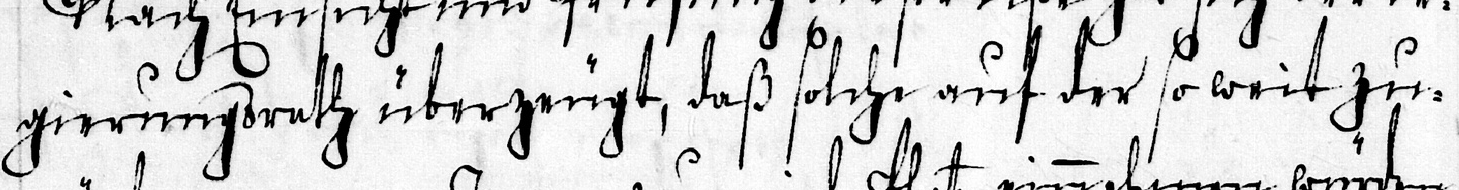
gierungsrath überzeugt, daß solche auf der soweit zu¬
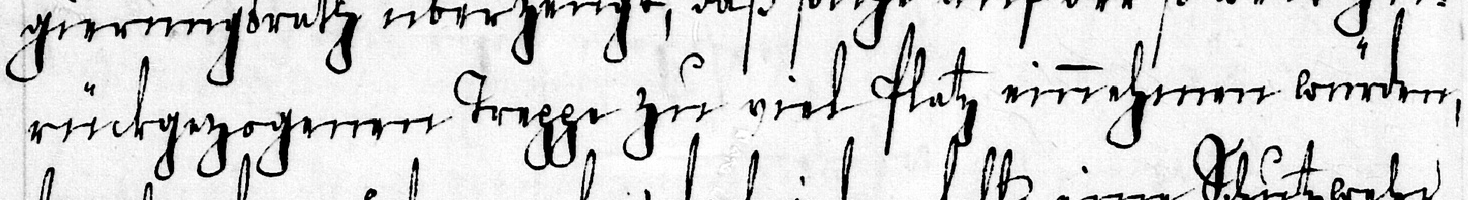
rückgezogenen Treppe zu viel Platz einnehmen würden,
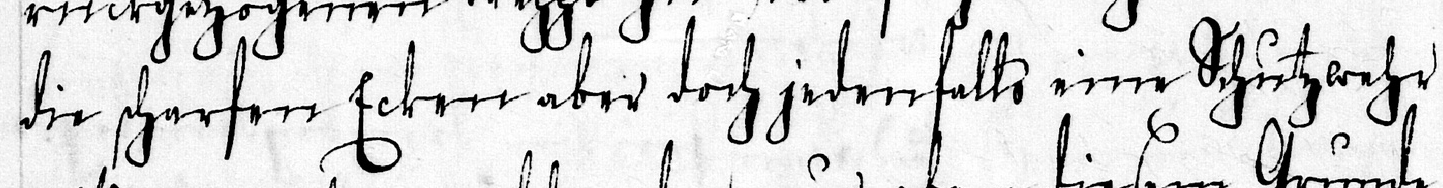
die scharfen Ecken aber doch jedenfalls eine Schutzwehr
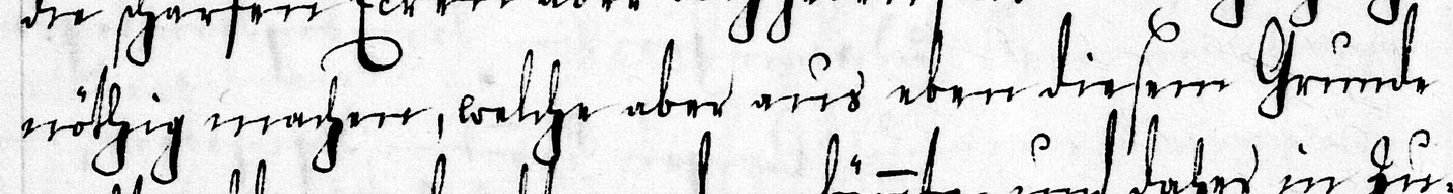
nöthig machen, welche aber aus eben diesem Grunde
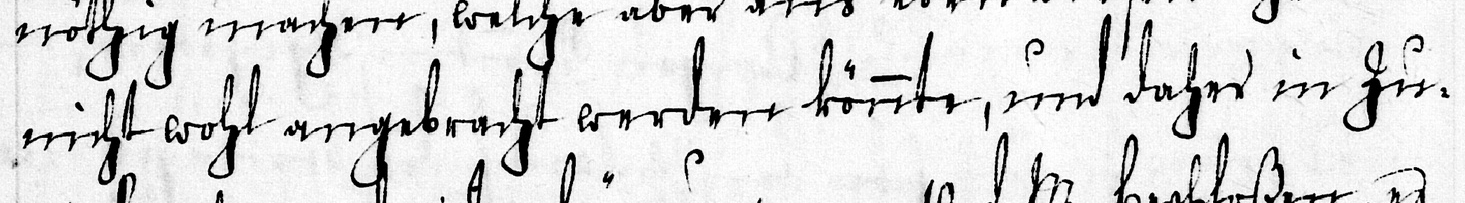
nicht wohl angebracht werden könnte, und daher in Zu¬
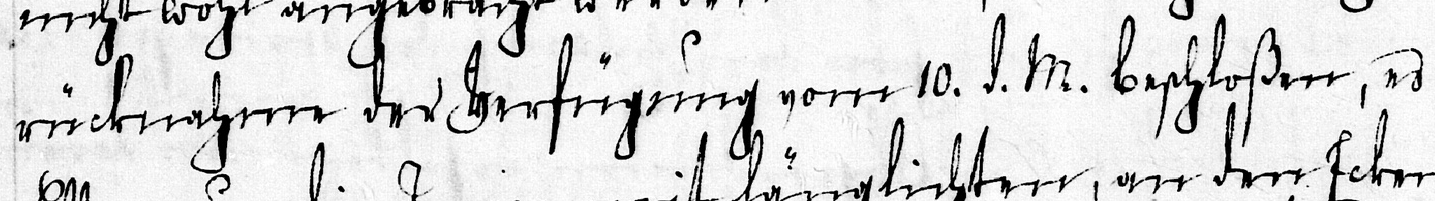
rücknahme der Verfügung vom 10. d. M. beschloßen, es
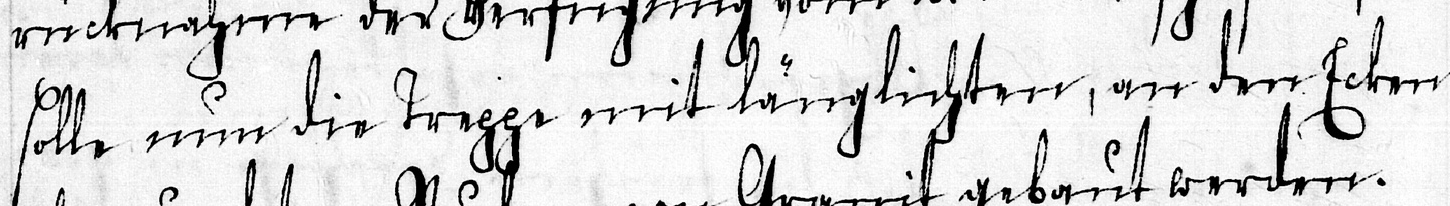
solle nun die Treppe mit länglichten, an den Ecken
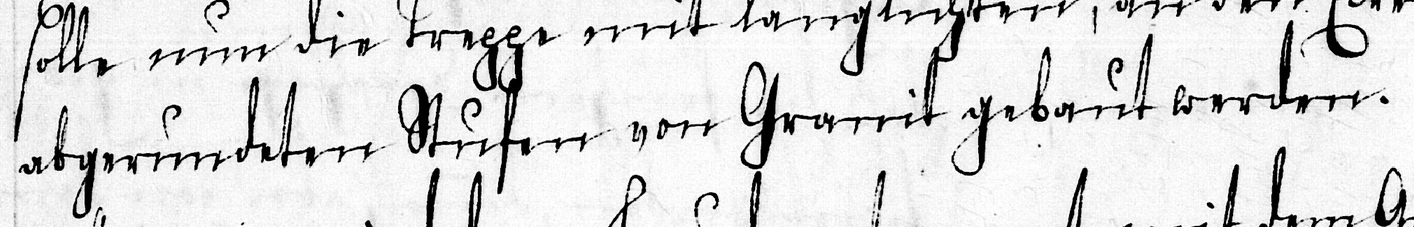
abgerundeten Stufen von Granit gebaut werden.
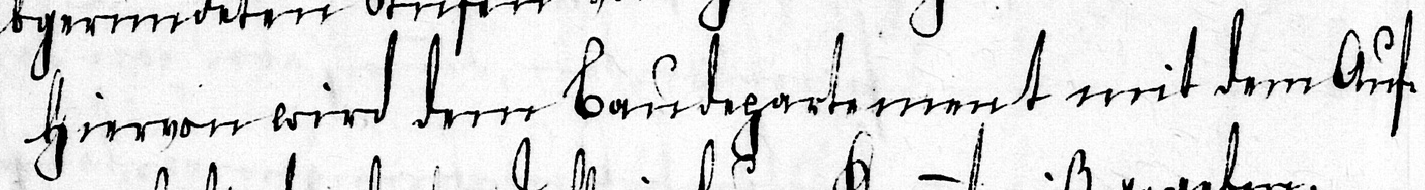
Hiervon wird dem Baudepartement mit dem Auf¬
